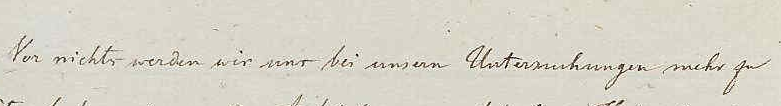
Vor nichts werden wir uns bei unsern Untersuchungen mehr zu
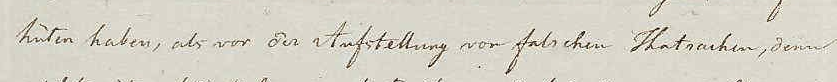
hüten haben, als vor der Aufstellung von falschen Thatsachen, denn
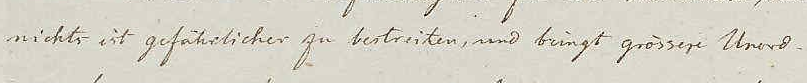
nichts ist gefährlicher zu bestreiten, und bringt grössere Unord-
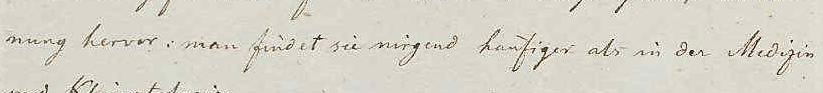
nung hervor: man findet sie nirgend häufiger als in der Medizin
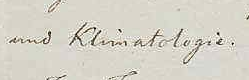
und Klimatologie.
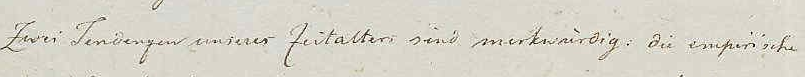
Zwei Tendenzen unseres Zeitalters sind merkwürdig: die empirische
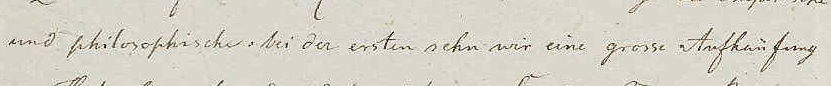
und philosophische: bei der ersten sehn wir eine grosse Aufhäufung
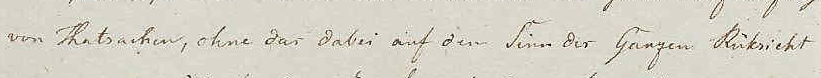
von Thatsachen, ohne dabei auf den Sinn der Ganzen Rüksicht
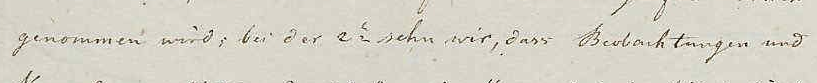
genommen wird; bei der 2￼ sehn wir, dass Beobachtungen und
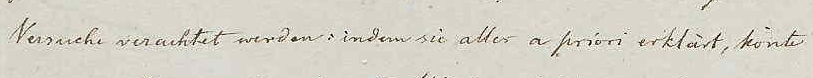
Versuche verachtet werden: indem sie alles a priori erklärt, könte
